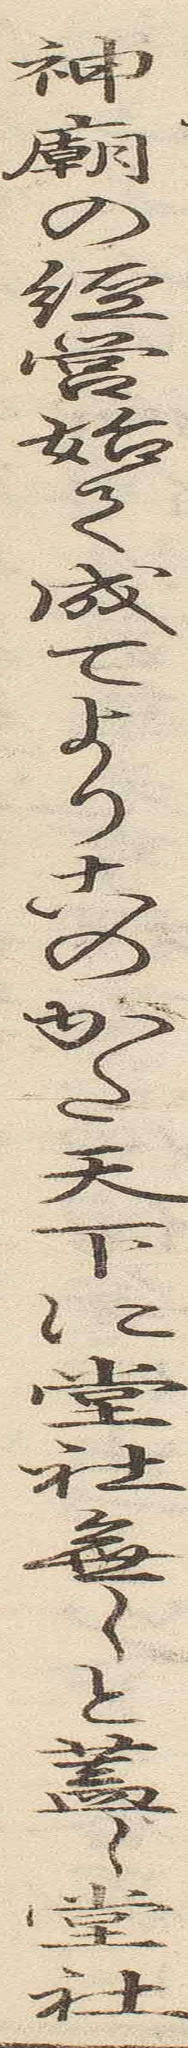神廟の經営始て成てよりこのかた天下に堂社無しと蓋し堂社
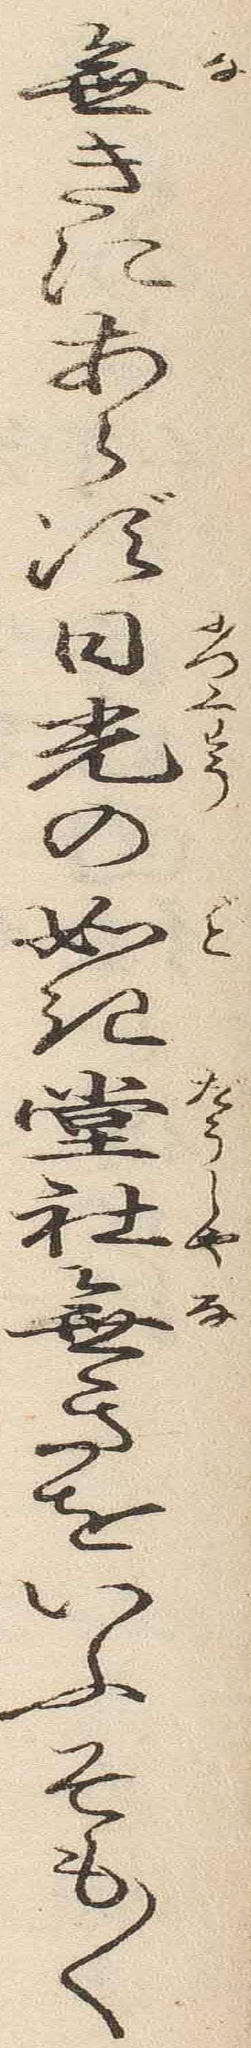無きにあらず日光の如き堂社無きをいふそも〳〵
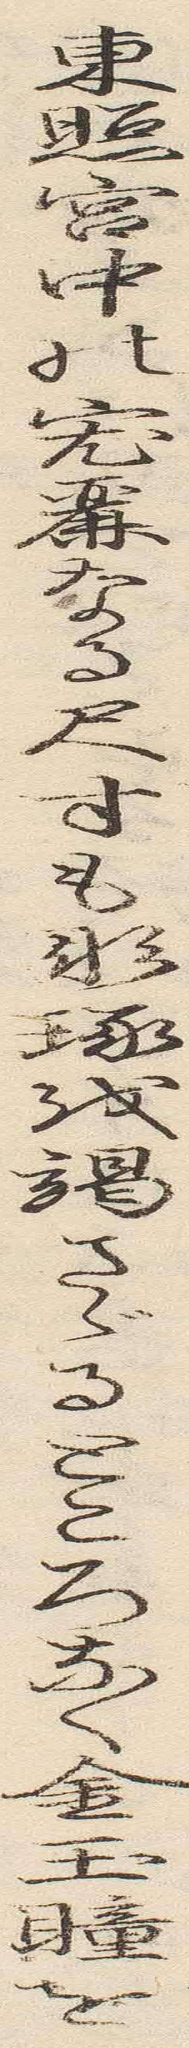東照宮中の宏麗なる尺寸も彫琢を竭さゞるところなく金玉瞳を
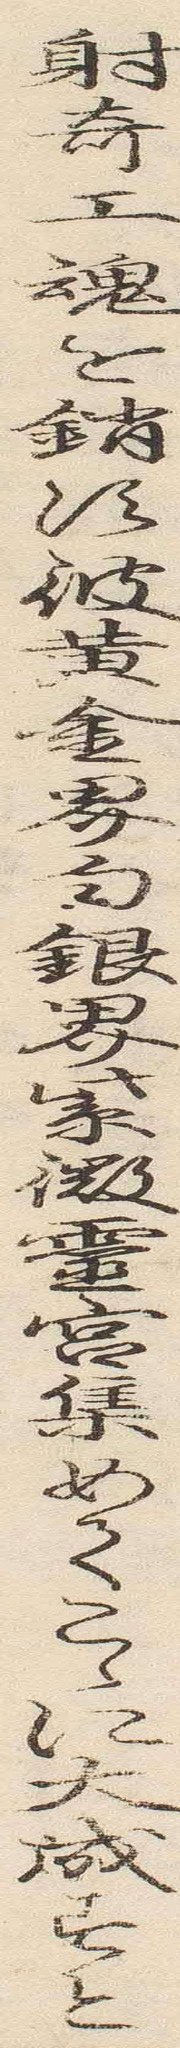射奇工魂を銷す彼黄金界白銀界紫微靈宮集めてこゝに大成すと
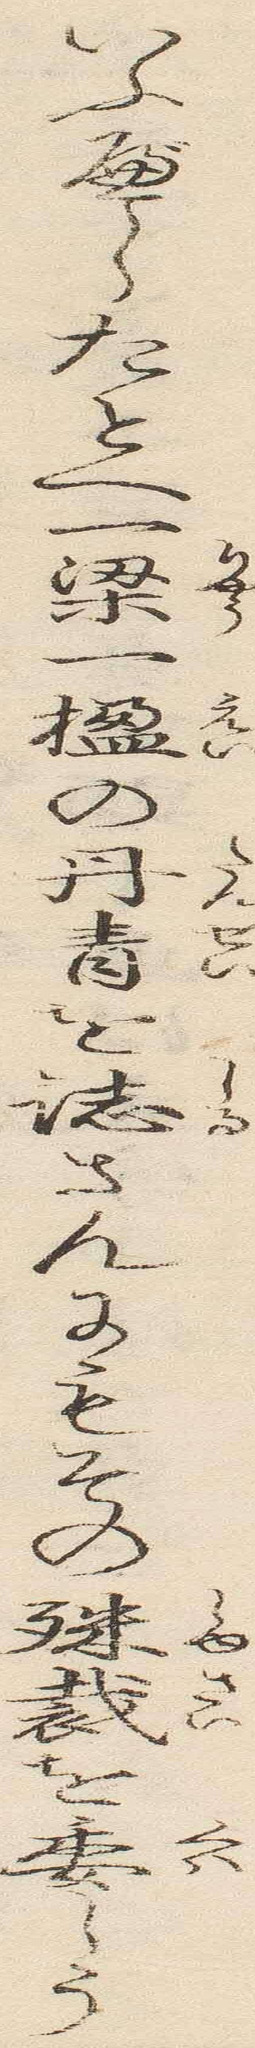いふべしたとへ一梁一楹の丹青を誌さんにもその殊裁を委しう
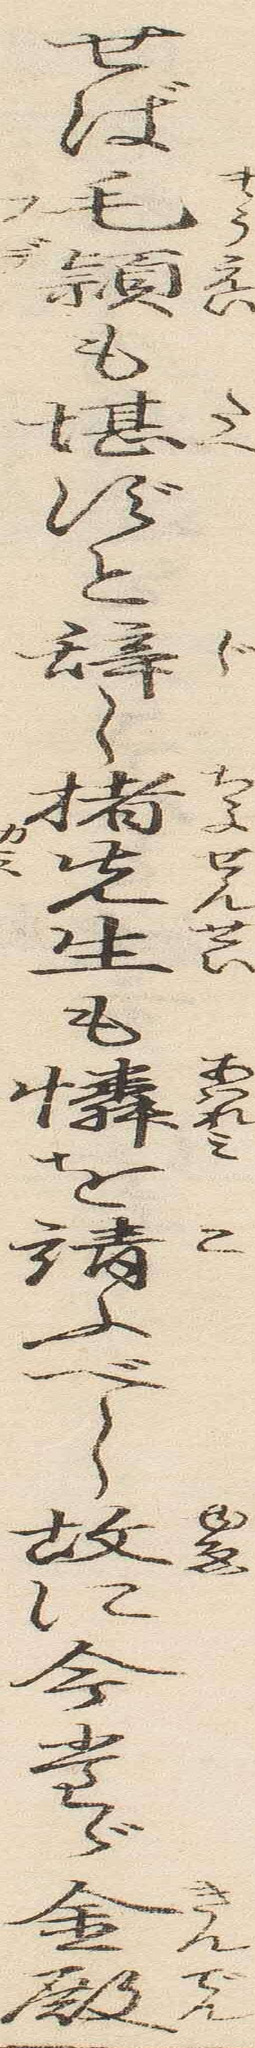せば毛頴も堪ずと辞し楮先生も憐を請ふべし故に今たゞ金殿
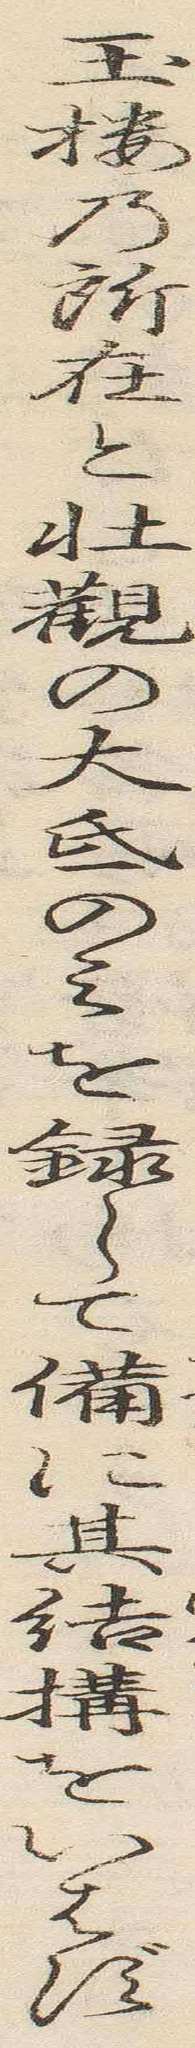玉楼の所在と壮觀の大氐のみを録して備に其結構をいはず
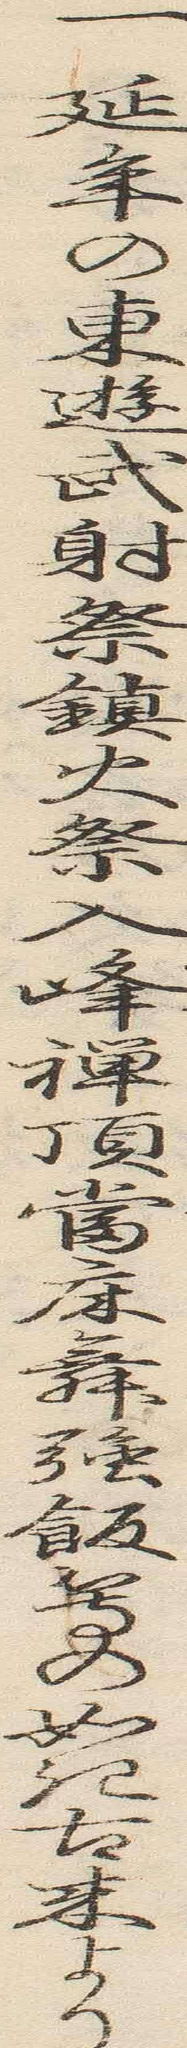一延年の東遊武射祭鎮火祭入峰禅頂當床舞強飯等の如き古来より
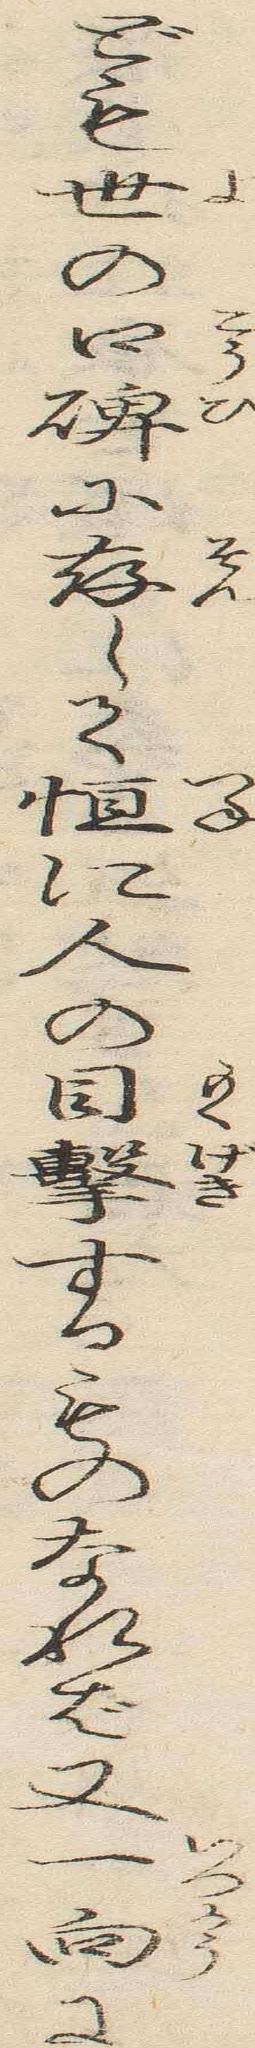ども世の口碑に存して恒に人の目撃するものなれば又一向に
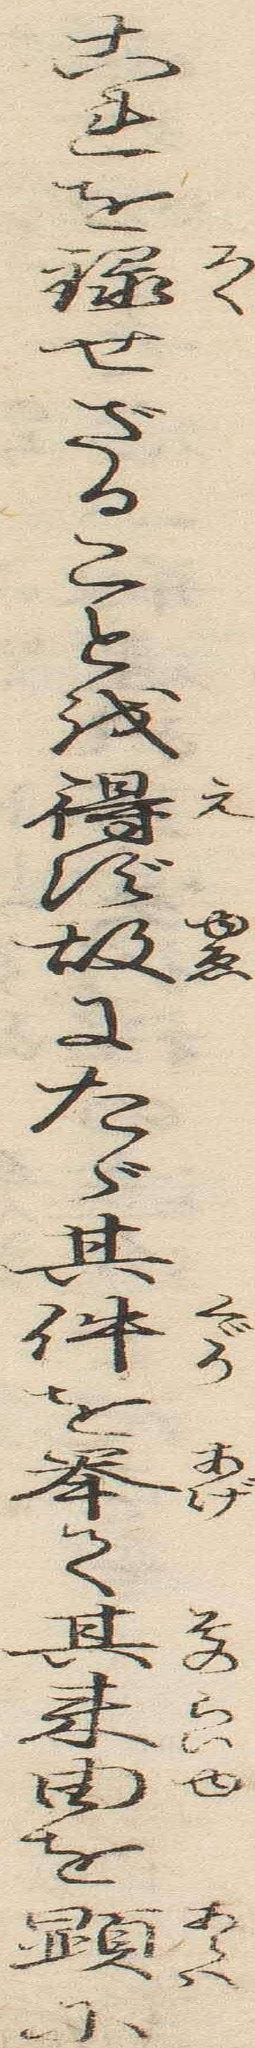これを録せざることを得ず故にたゞ其件を挙て其来由を顕に
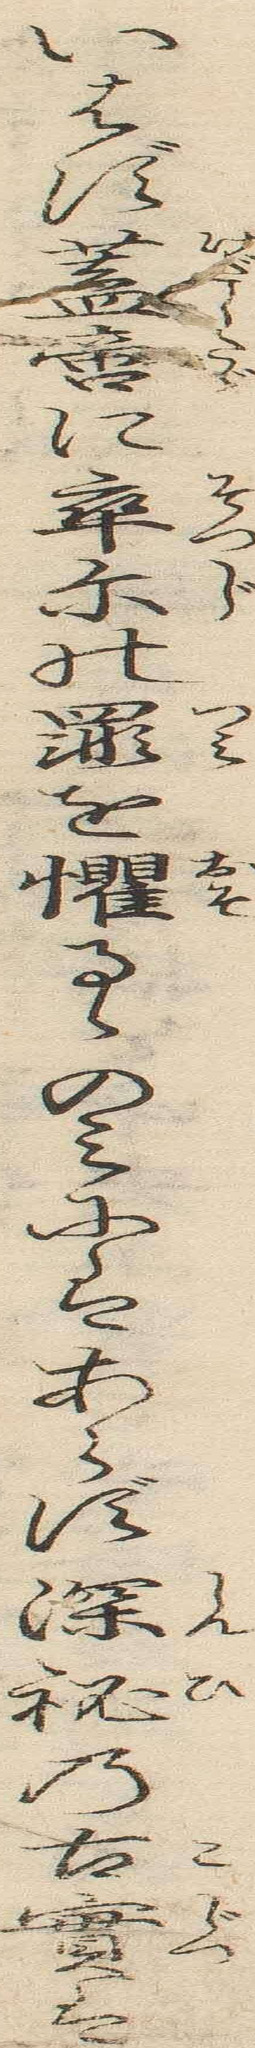いはず蓋啻に卒尓の罪を懼るゝのみにはあらず深秘の古實は
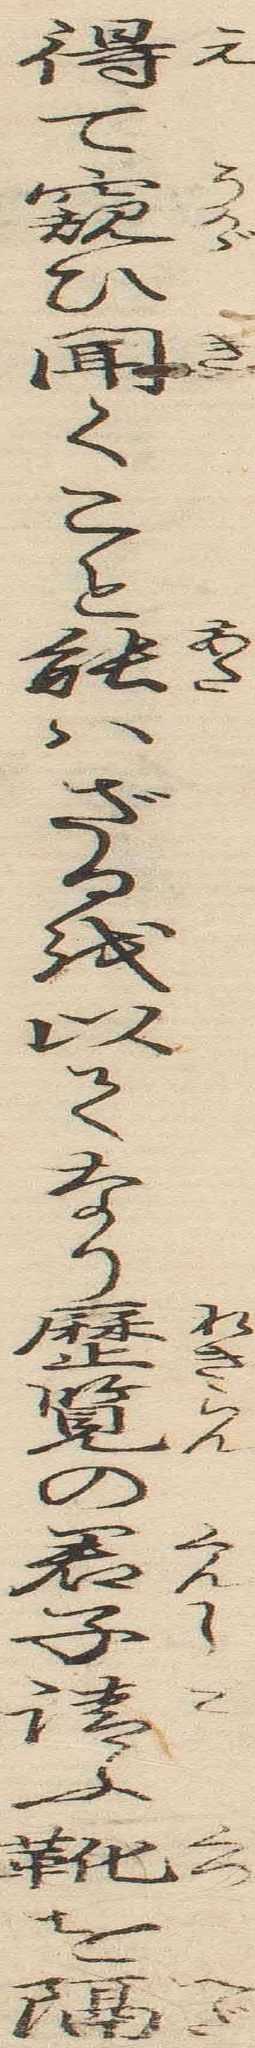得て窺ひ聞くこと能はざるを以てなり歷覧の君子請ふ靴を隔

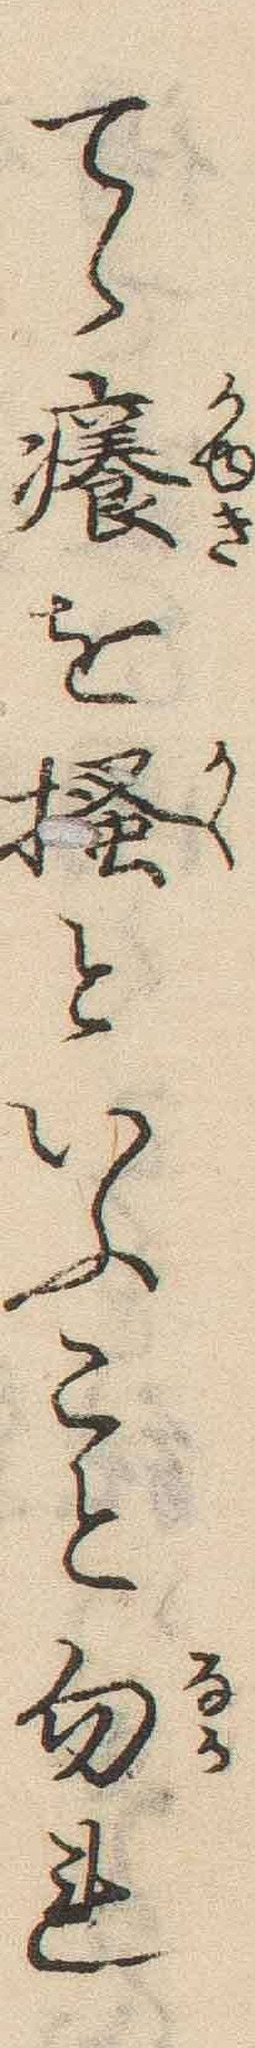てゝ癢を掻といふこと勿れ
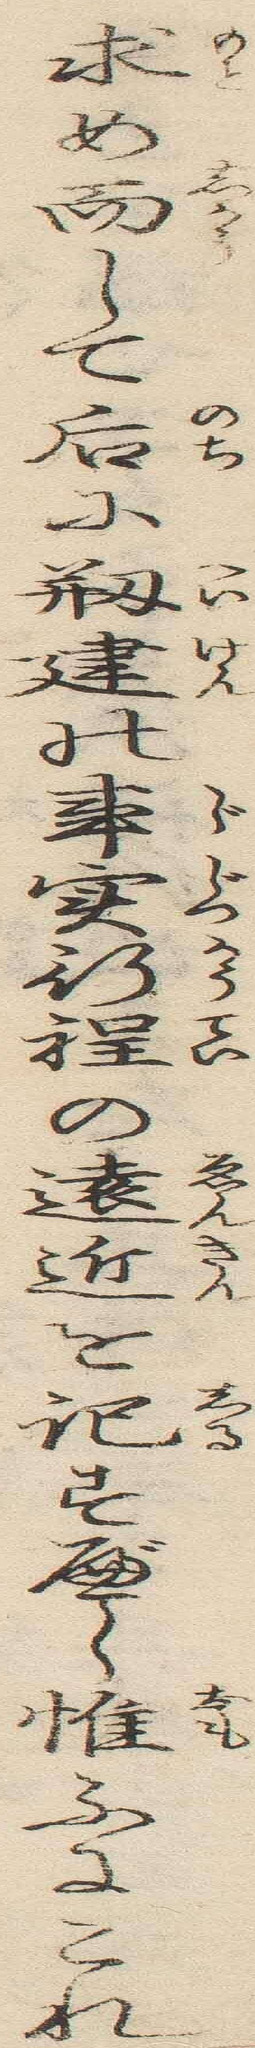求め而して后に剏建の事実行程の遠近を記すべし惟ふにこれ
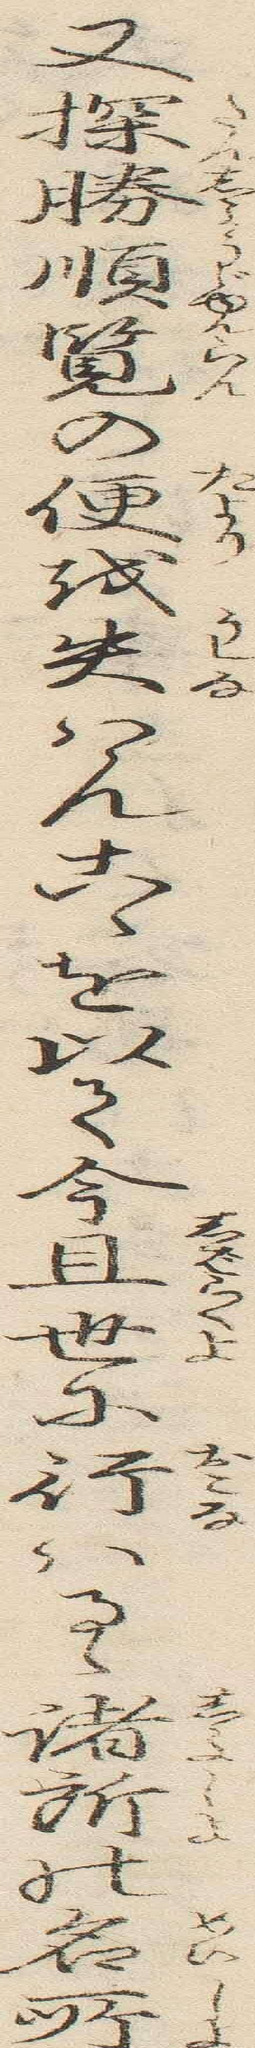又探勝順覧の便を失はんこゝを以て今且世に行はるゝ諸所の名所
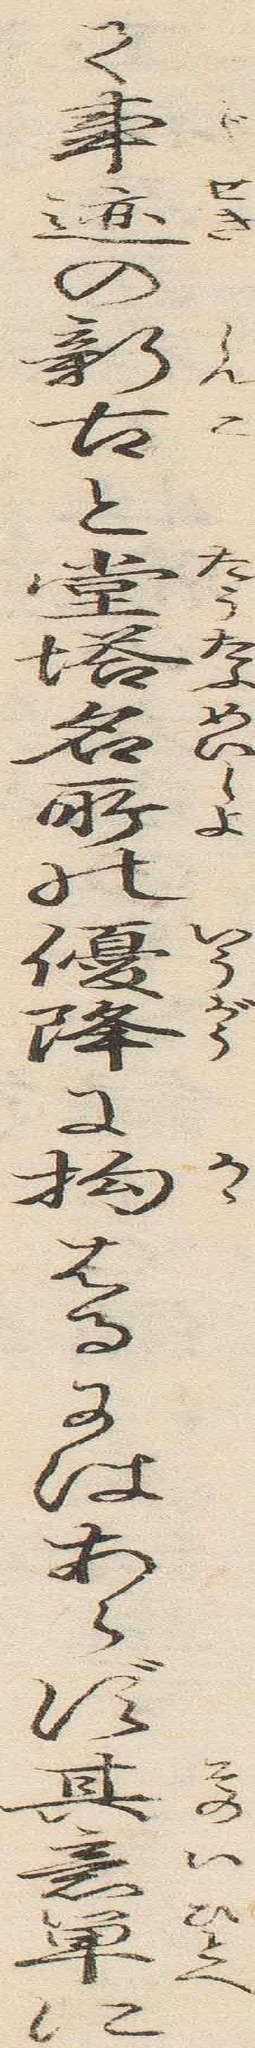て事迹の新古と堂塔名所の優降に抅はるにはあらず其意単に
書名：日光山志
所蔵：東京学芸大学附属図書館 国文学研究資料館
